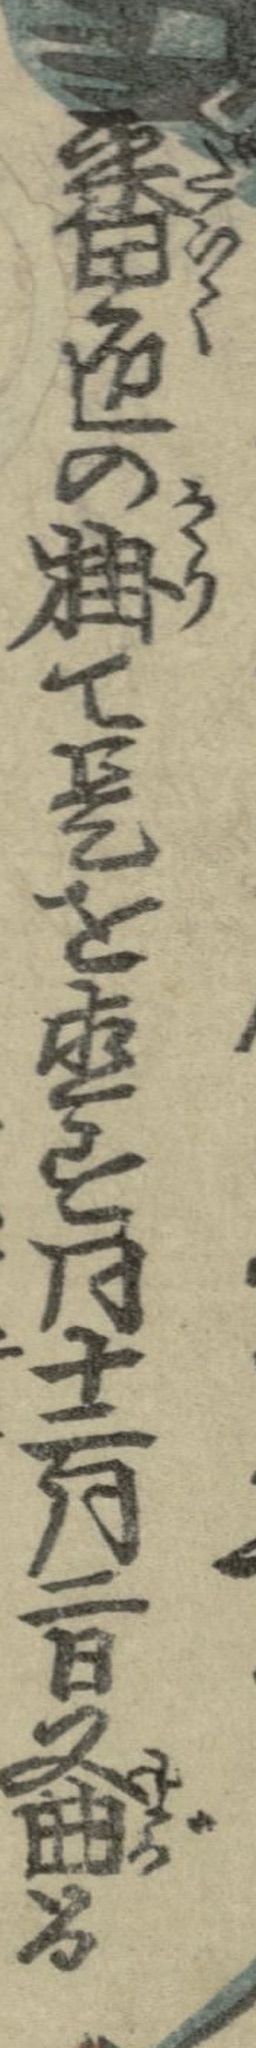番匠の掛て是を直す同十二月二日又曲る
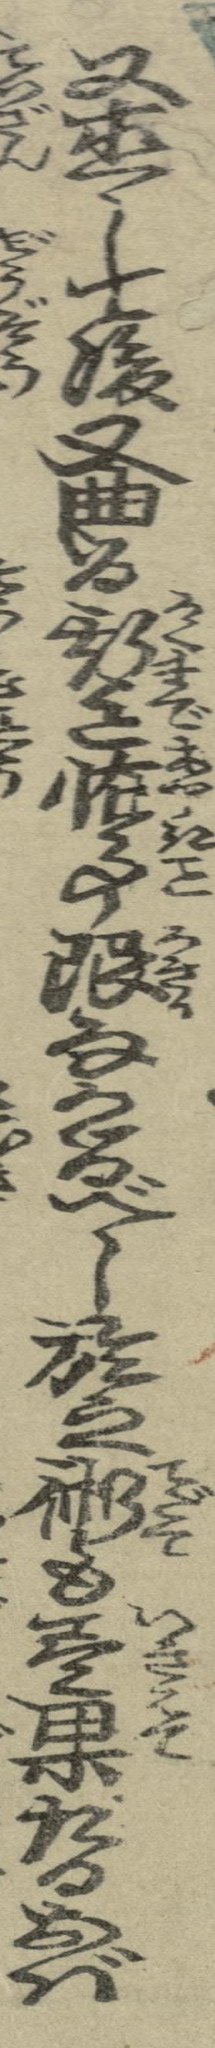又直して後又曲る斯迄怪事限なかるべし於之術も尽果たるおば
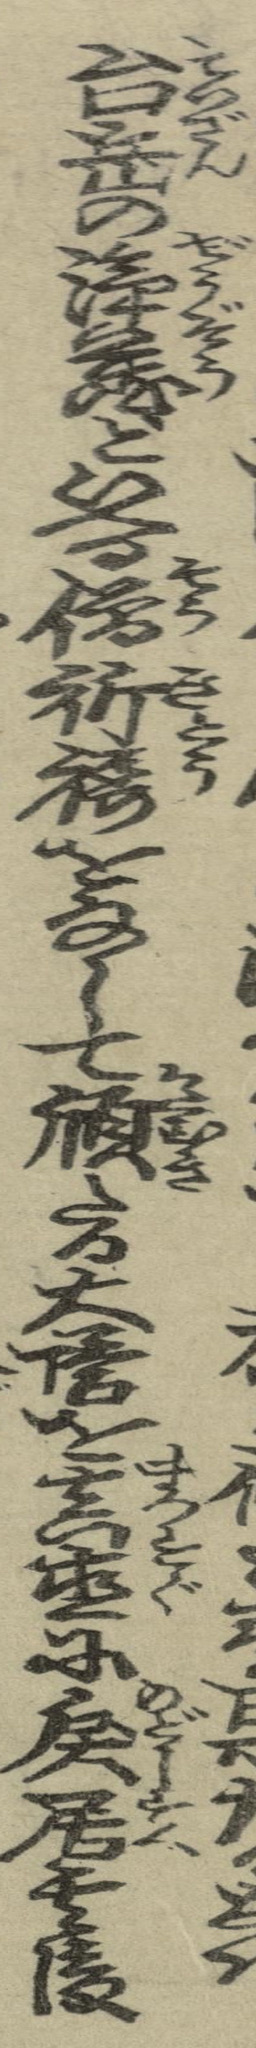台岳の浄蔵といへる僧祈祷をなして傾たる大塔を真直に戻居其後
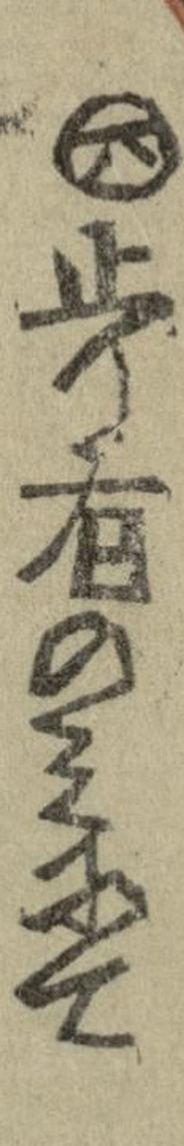㊅止り右のみにて
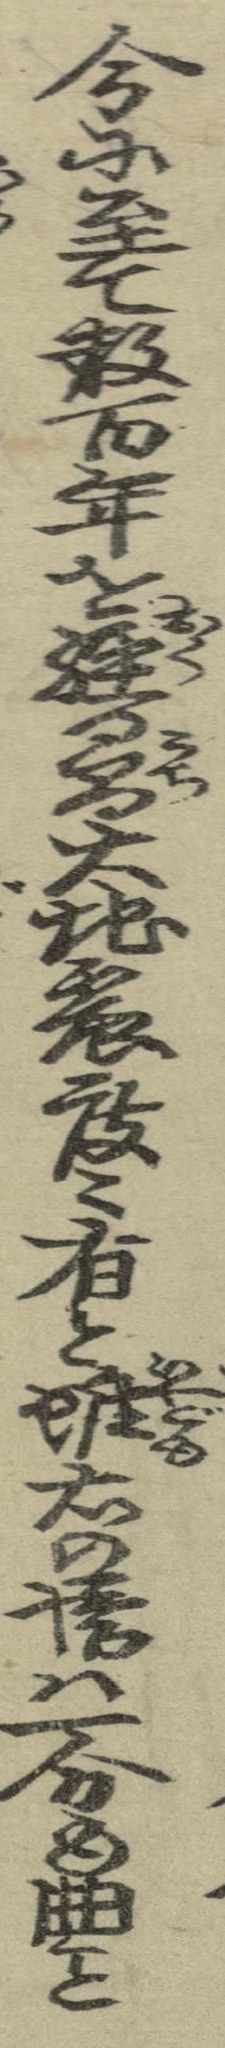今に至て数百年を経る間大地震度々有と雖右の塔は一分も曲こと
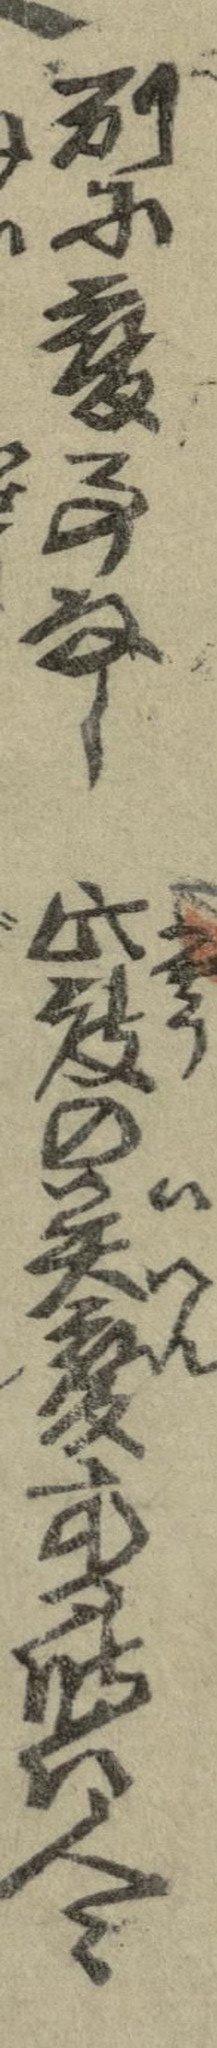別に変事なし此度の異変ある時は人々
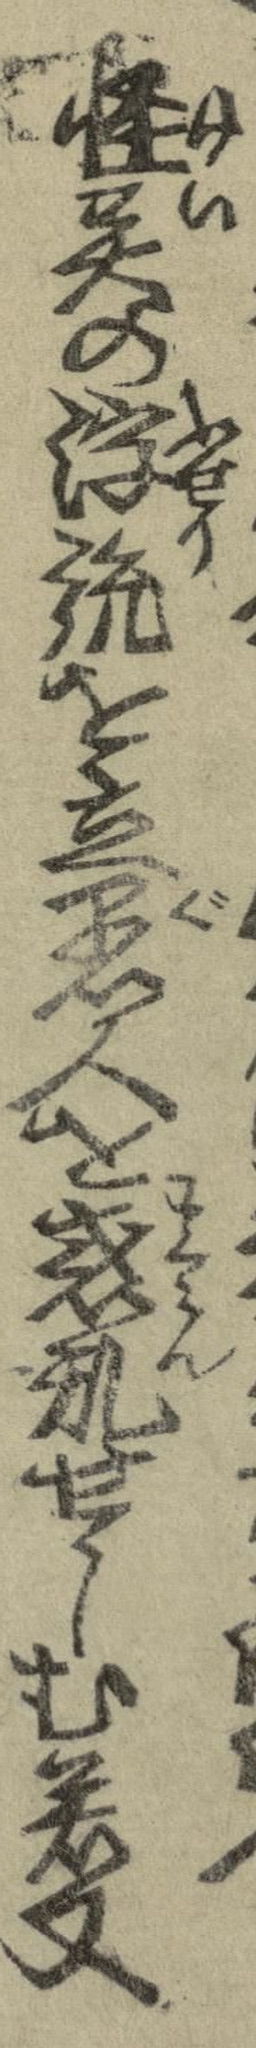怪異の浮説を立愚人を惑乱せしむ若又
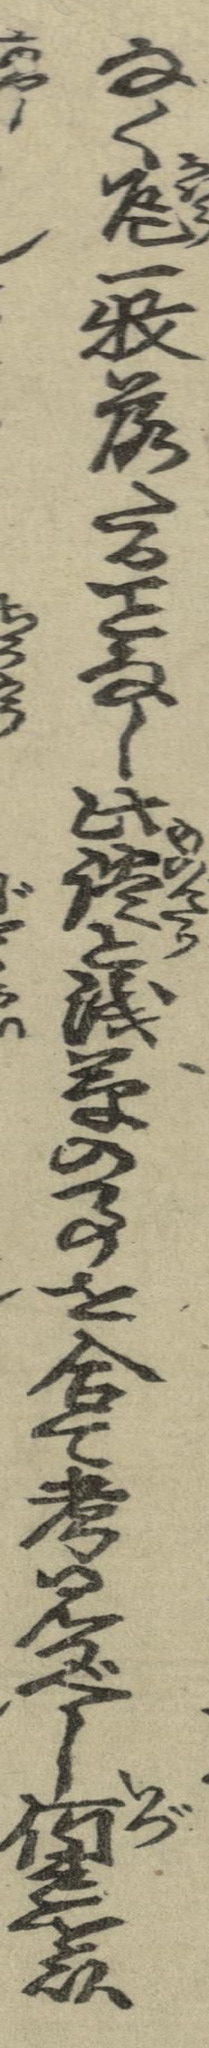なく瓦一枚落たることなし此談と浅草の事を合て考見るべし何れを以
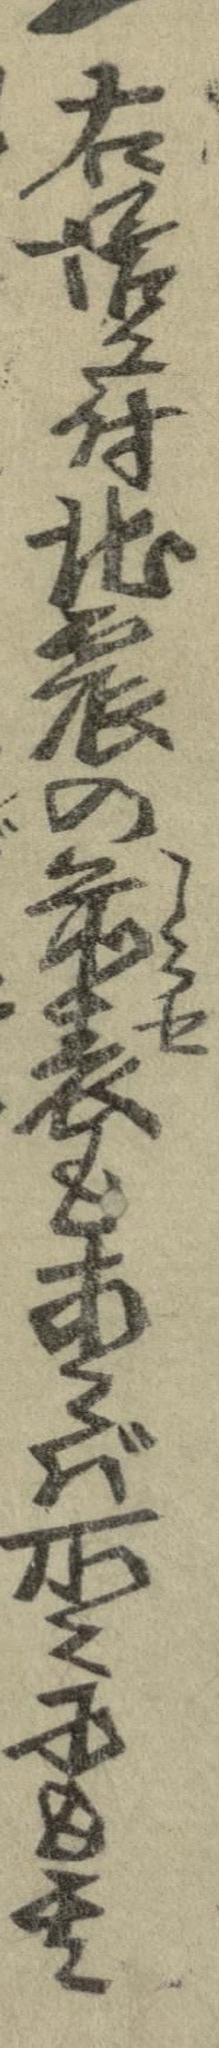右塔ニ付地震の前表もあらば所々にも其
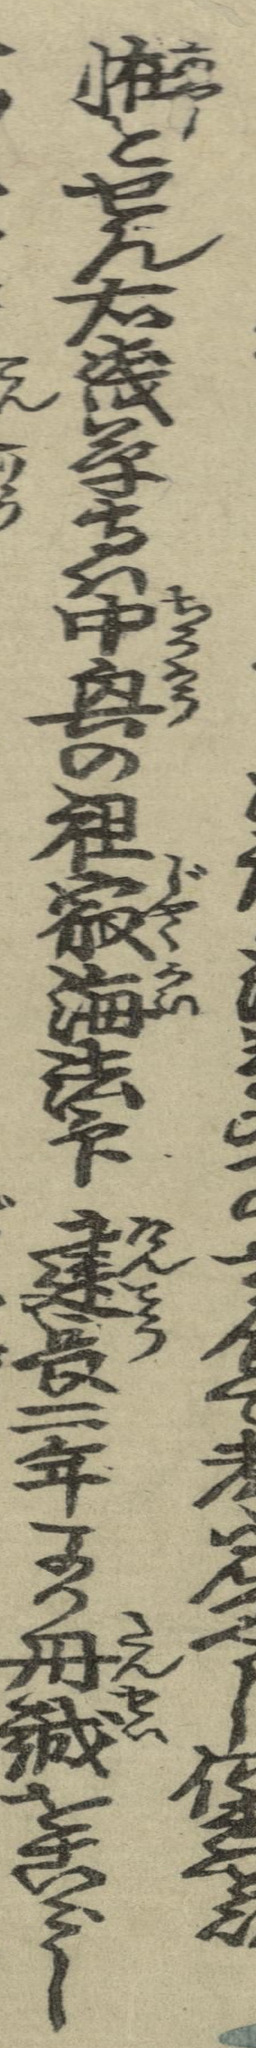怪とセん右浅草寺は中興の祖寂海法印建長二年より丹誠をこらし
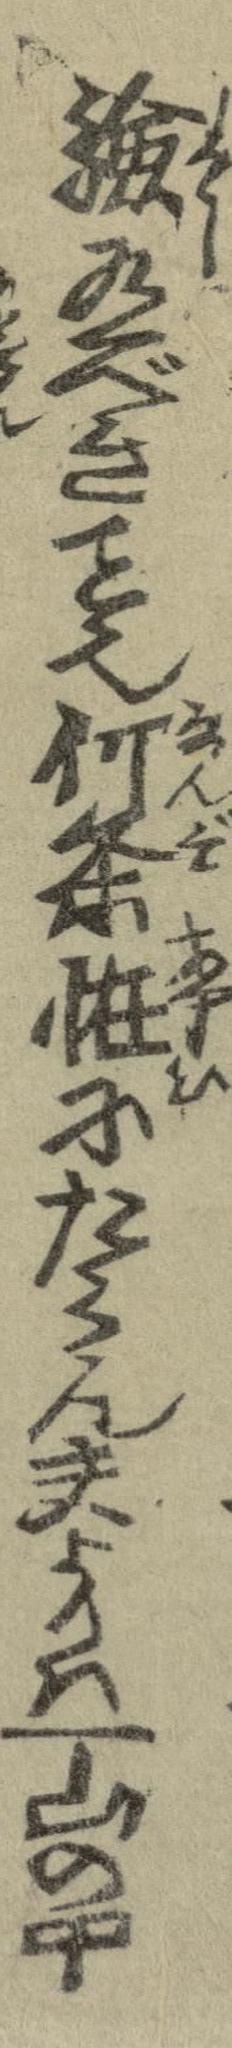験有べきこと也何条怪にたらん夫よりは一山の中
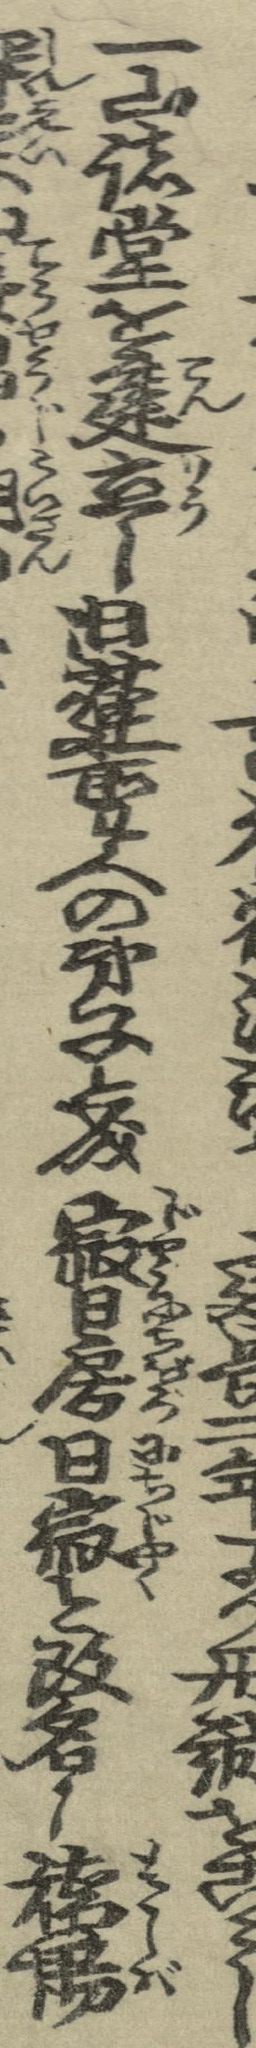一山諸堂を建立し日蓮聖人の弟子と成寂日房日寂と改名し橋場
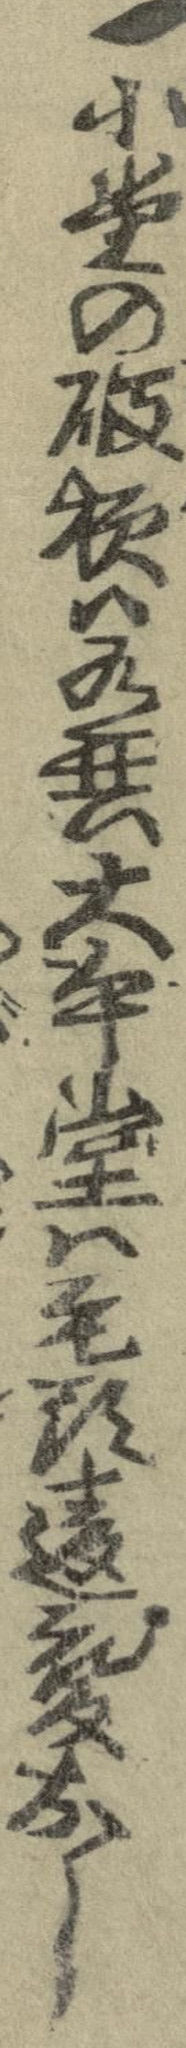小堂の破損は有共大本堂は毛頭違変なし
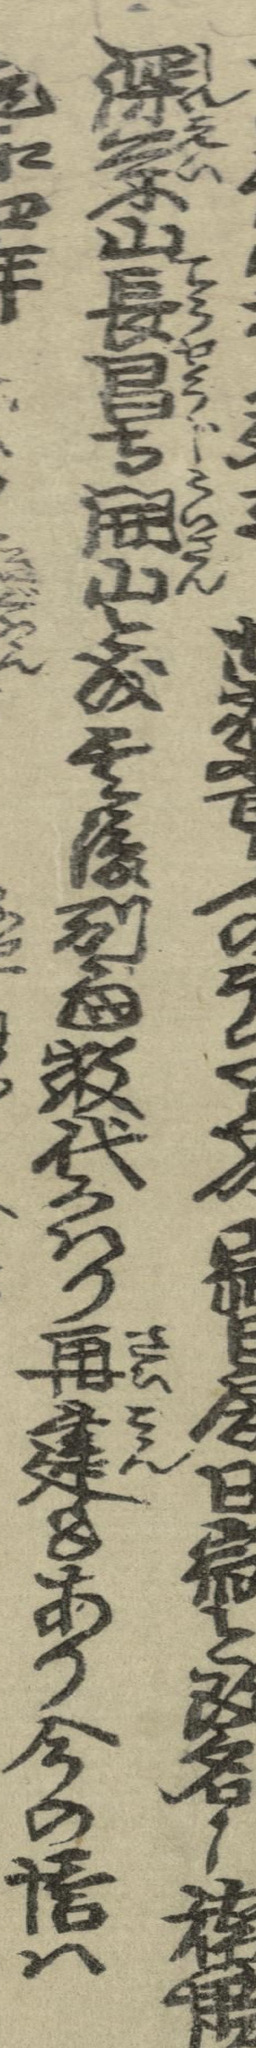深栄山長昌寺開山と成其後別当数代かはり再建もあり今の塔は
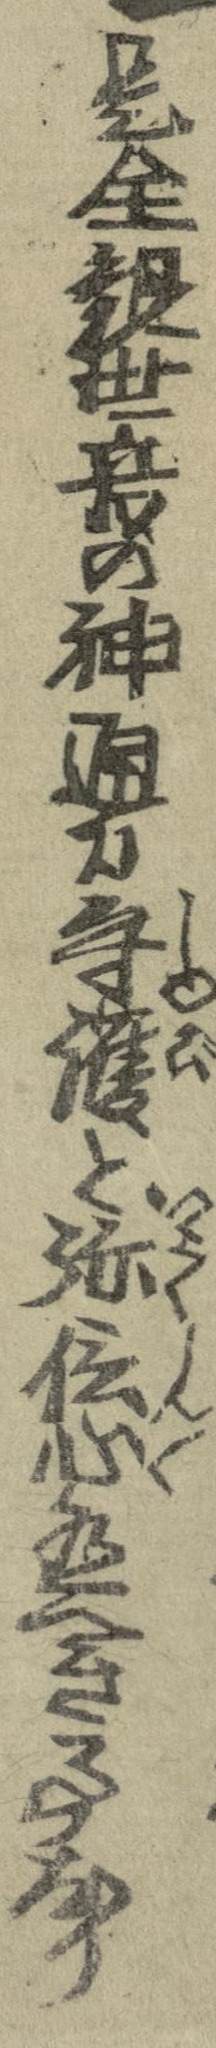是全観世音の神通力守護と弥と信心有へき事なり
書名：浅草寺大塔解譯
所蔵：東京大学地震研究所図書室 Earthquake Research Institute Library, The University of Tokyo, JAPAN
